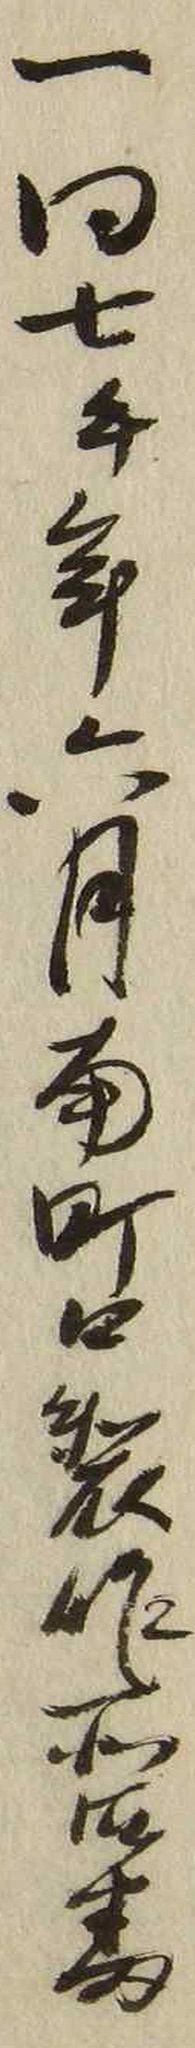一同七午年六月南町口製作所御番
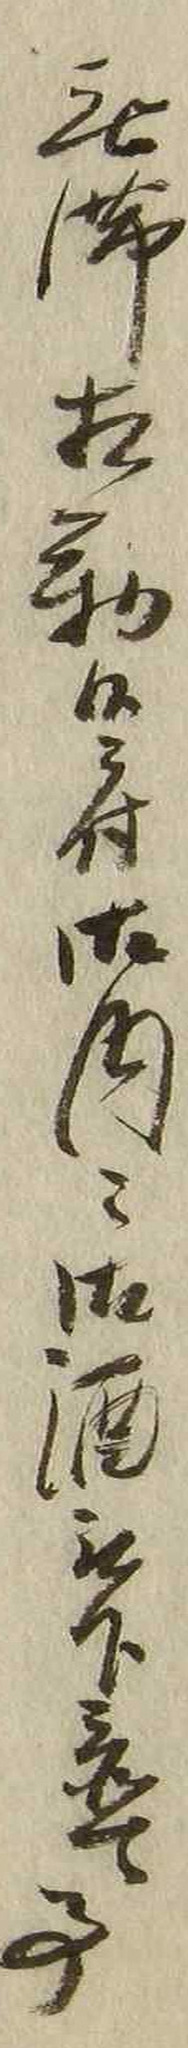無滞相勤候に付御内々御酒被下置候事
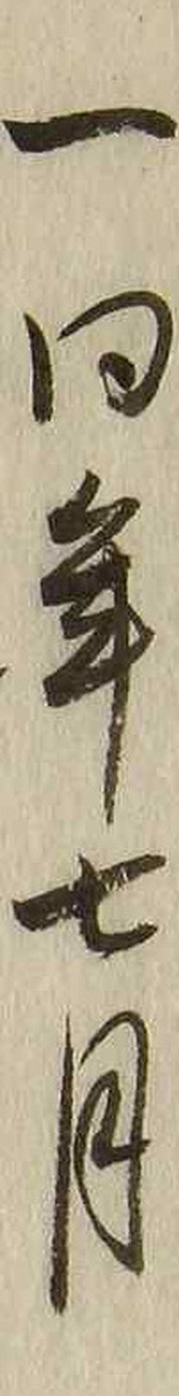一同年七月
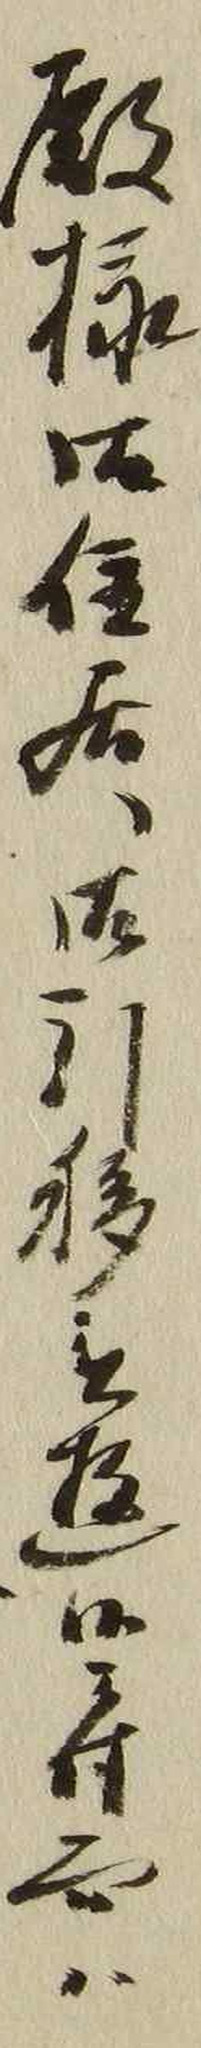殿様御住居へ御引移被遊候に付而は
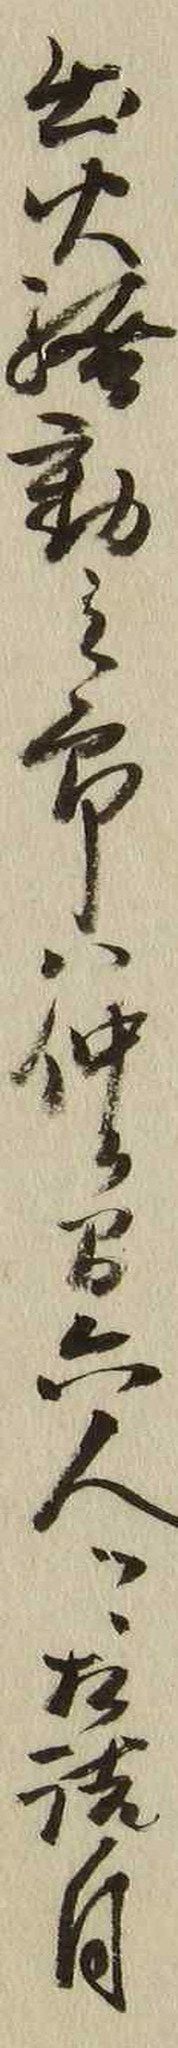出火騒動之節は仲け間六人つゝ相詰自
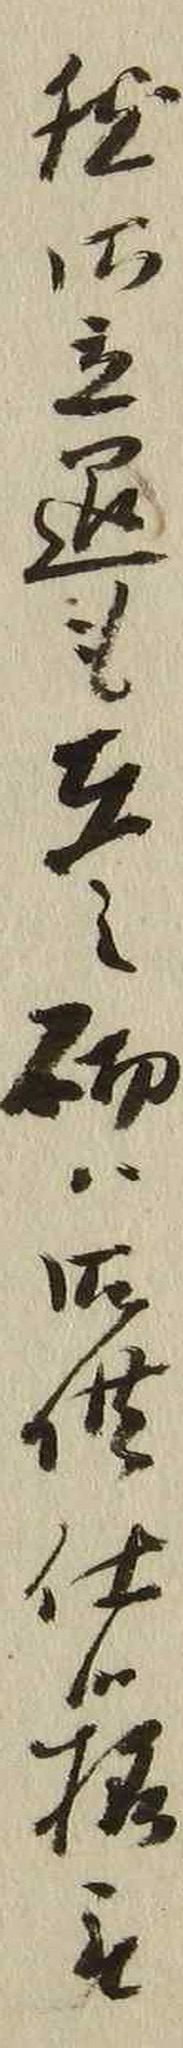然御立退も在之砌は御供仕候様被
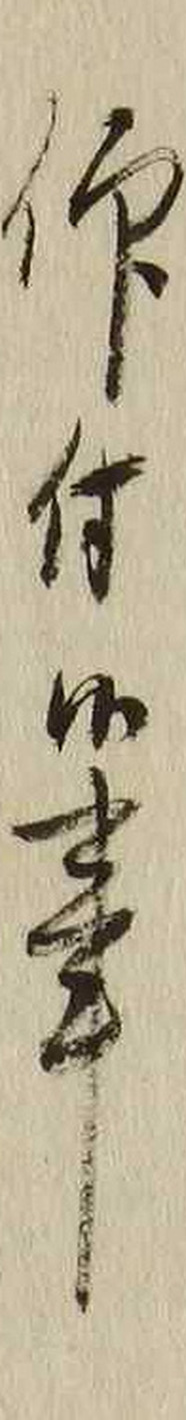仰付候事
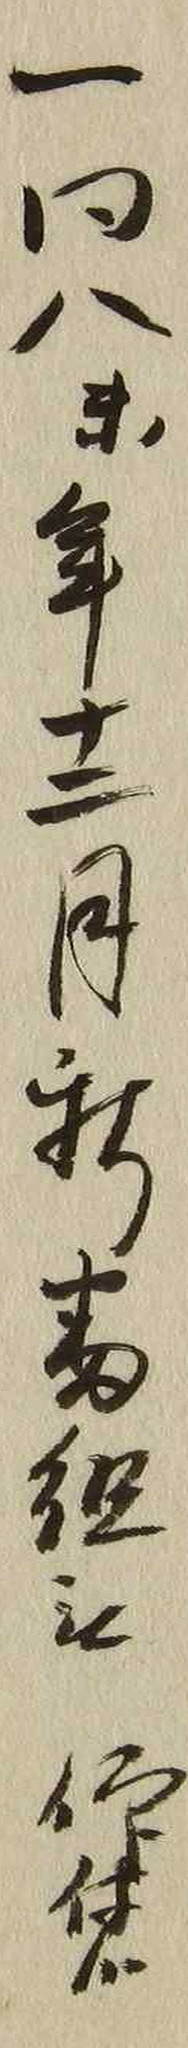一同八未年十二月新番組被仰付候
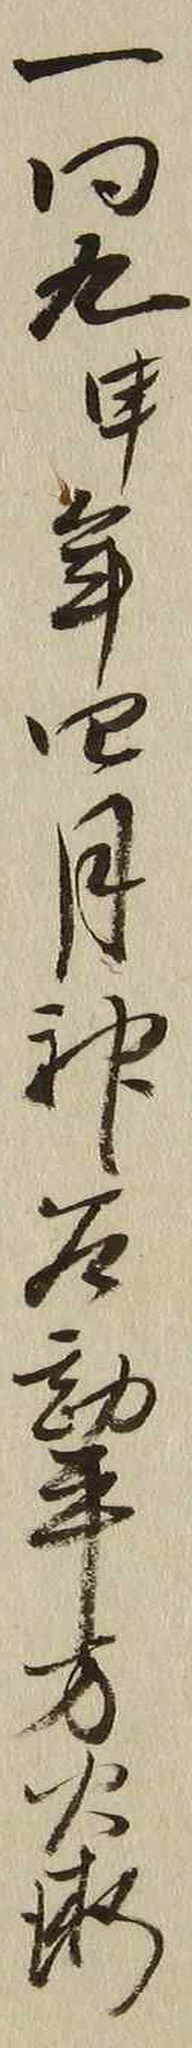一同九申年四月神石方火術
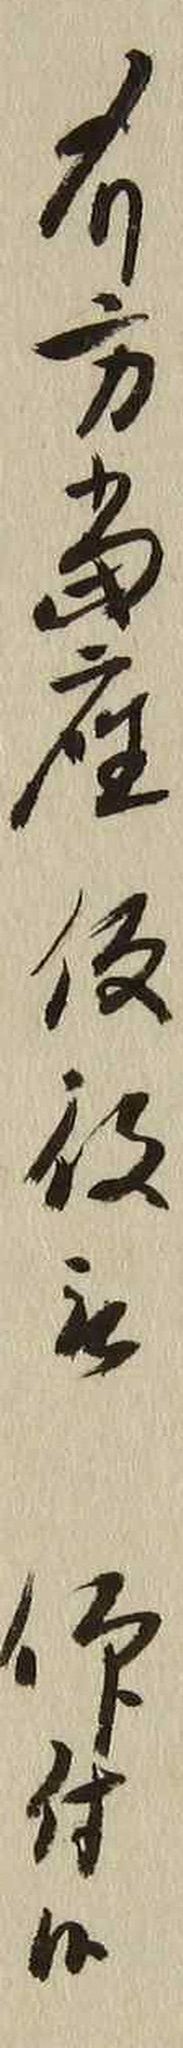有方当座仮役被仰付候
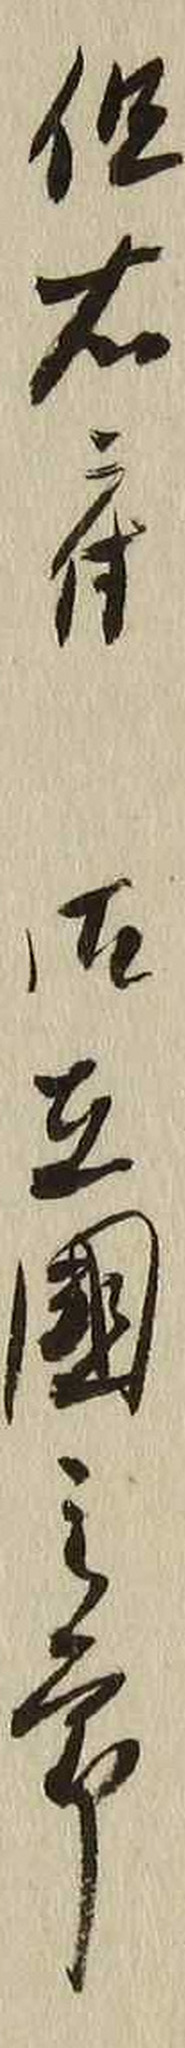但右に付御在国之節
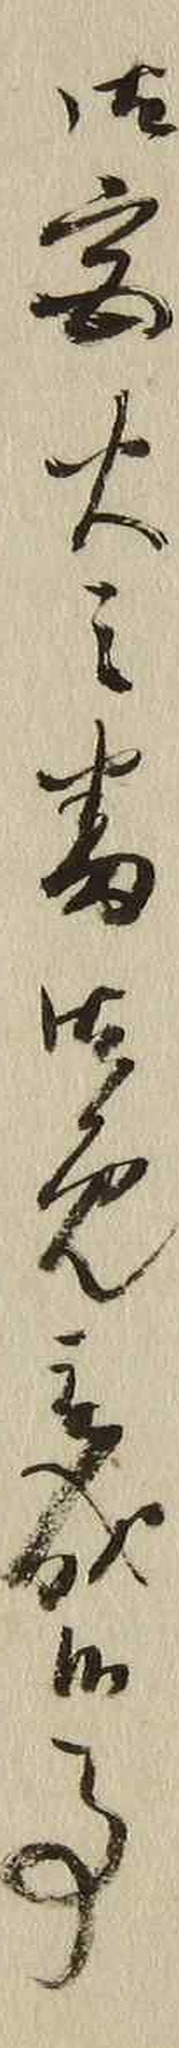御宮火之番御免被成候事
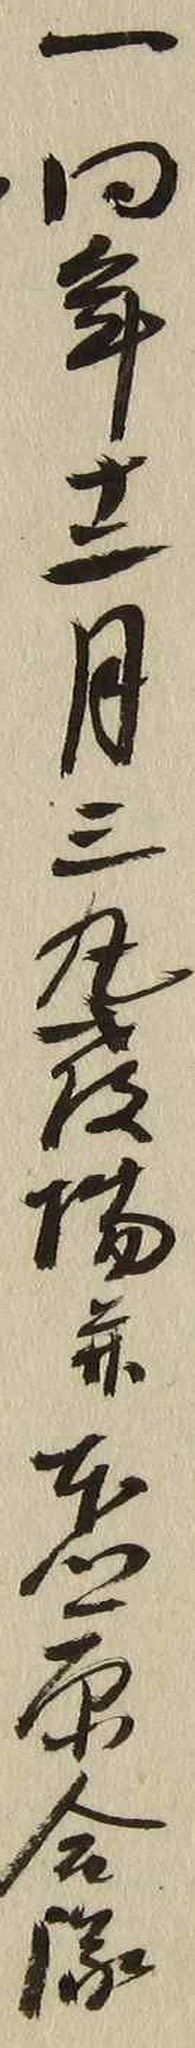一同年十二月三ノ丸教場并本郷原合隊
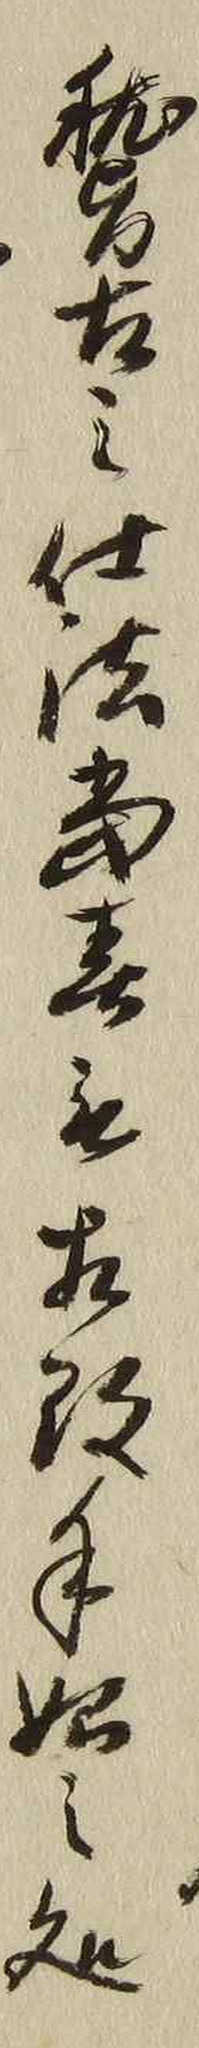稽古之仕法当春被相改手始之処
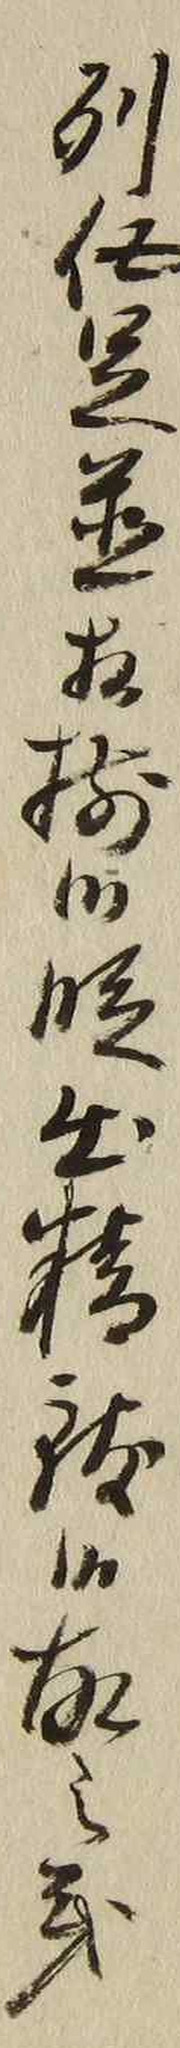列伍足並相揃候段出精致候故之義
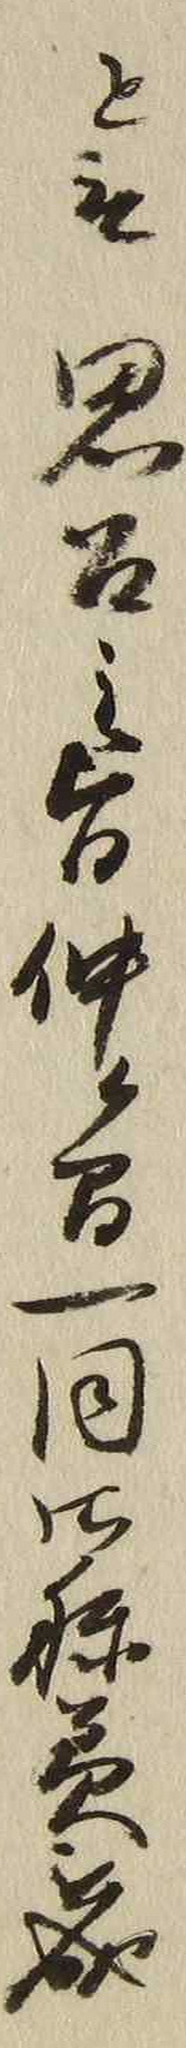と被思召之旨仲け間一同御称美被成
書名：諸士系譜　巻之360　す之部10
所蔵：会津若松市立会津図書館
